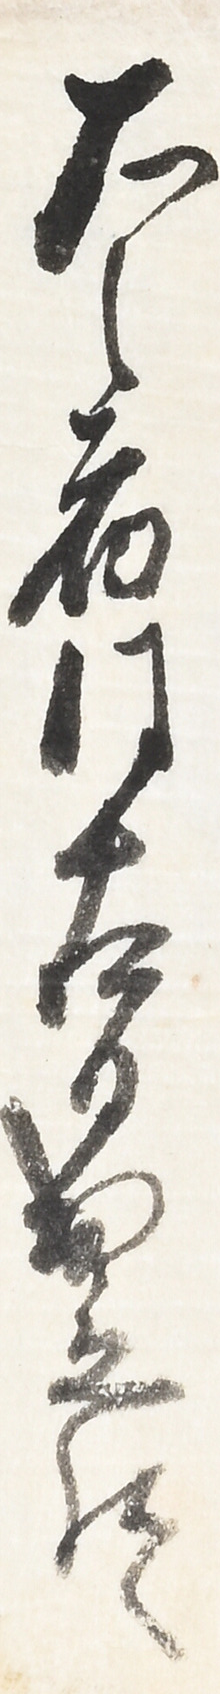右之者同十四日出立仕候
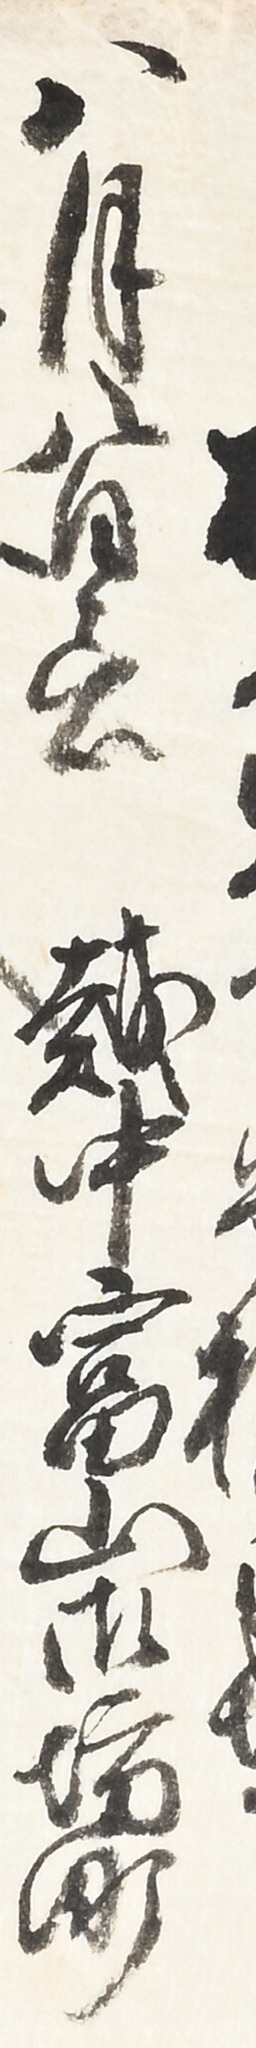八月八日着越中富山御坊町
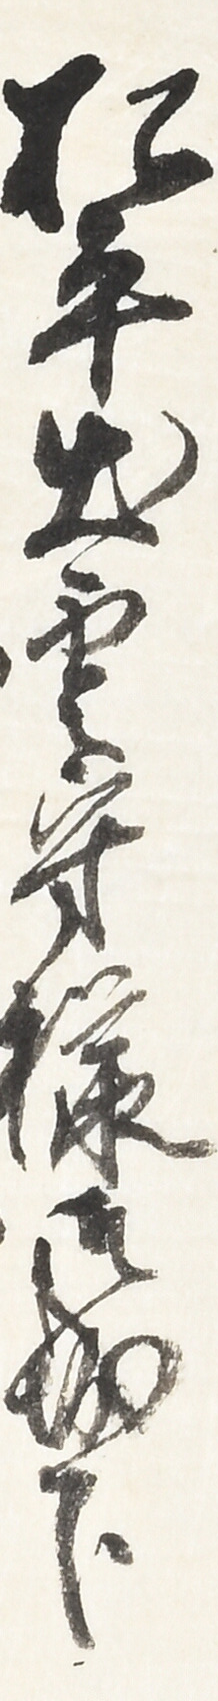松平出雲守様御城下
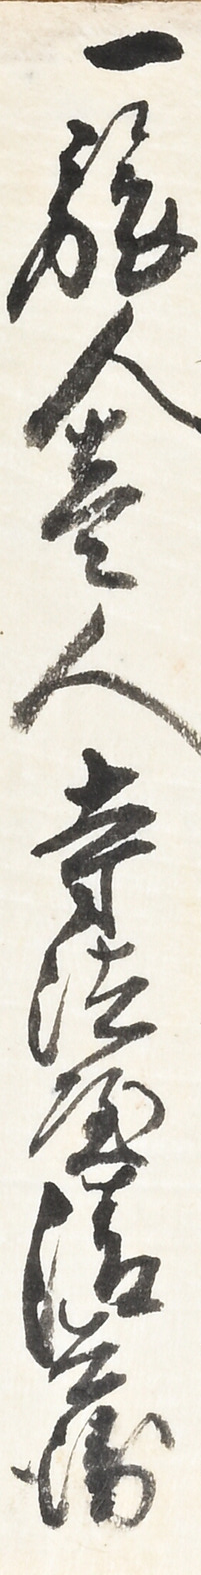一旅人壱人寺法屋清兵衛
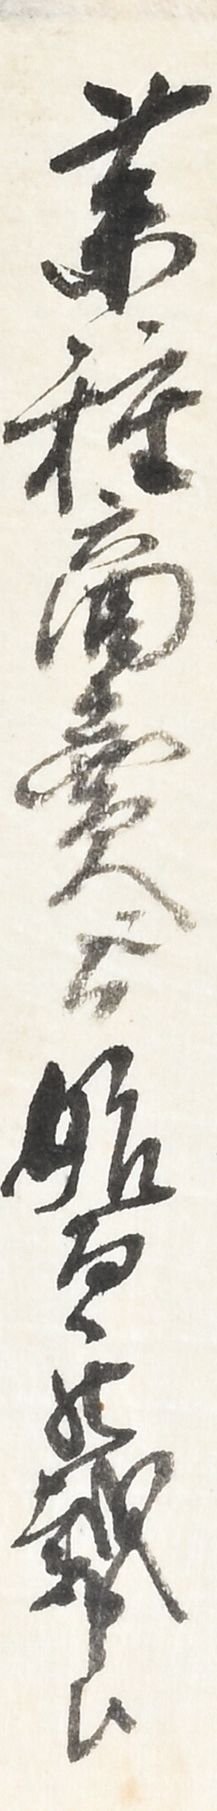薬商売ニ而始而罷越申候
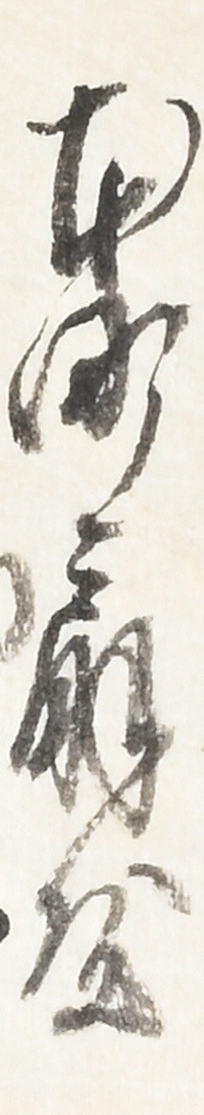本町扇屋
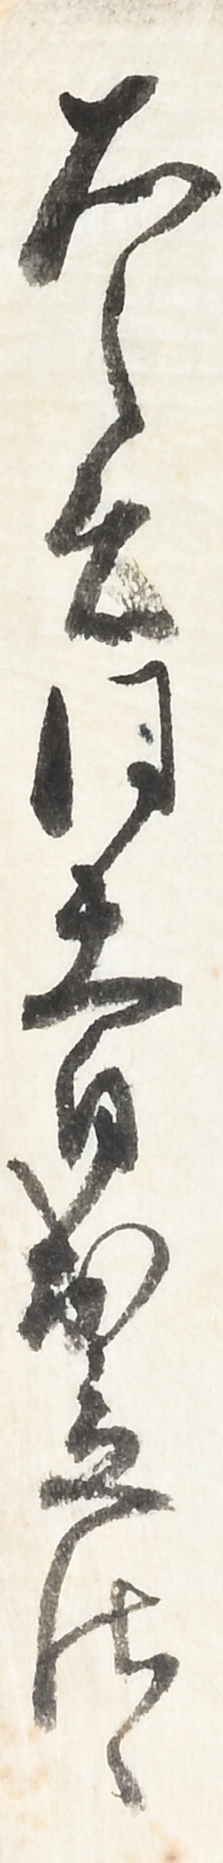右之者同十四日出立仕候
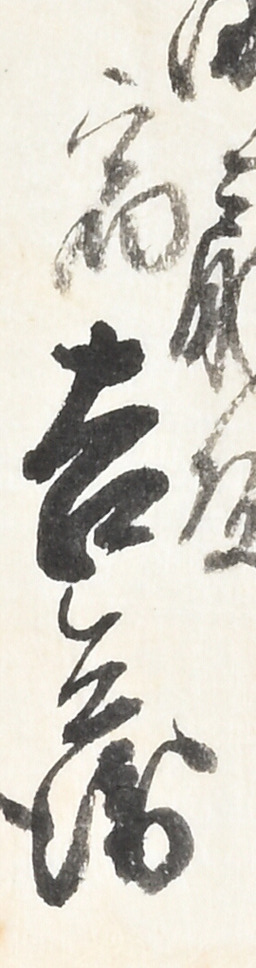宿吉兵衛

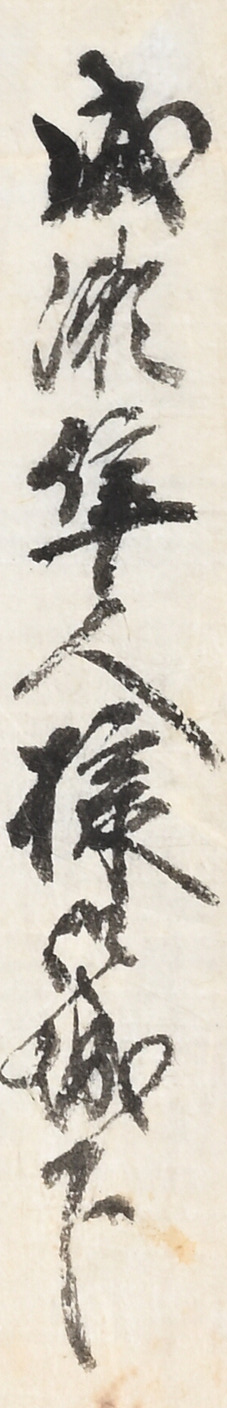成瀬隼人様御城下
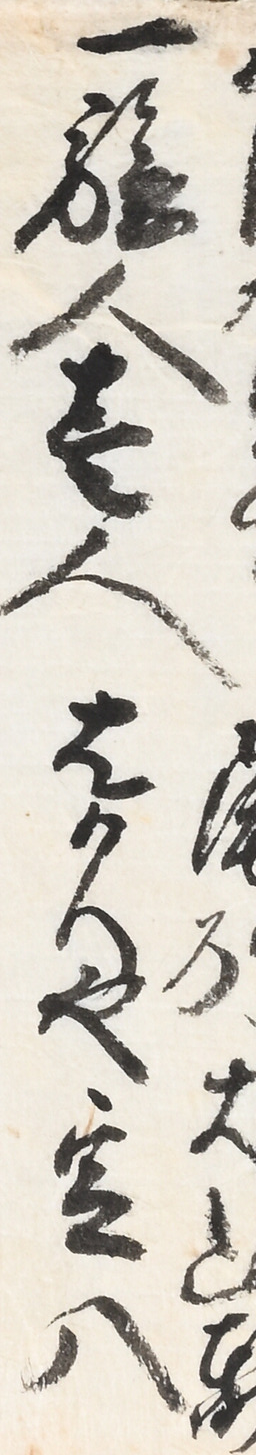一旅人壱人はかりや定八
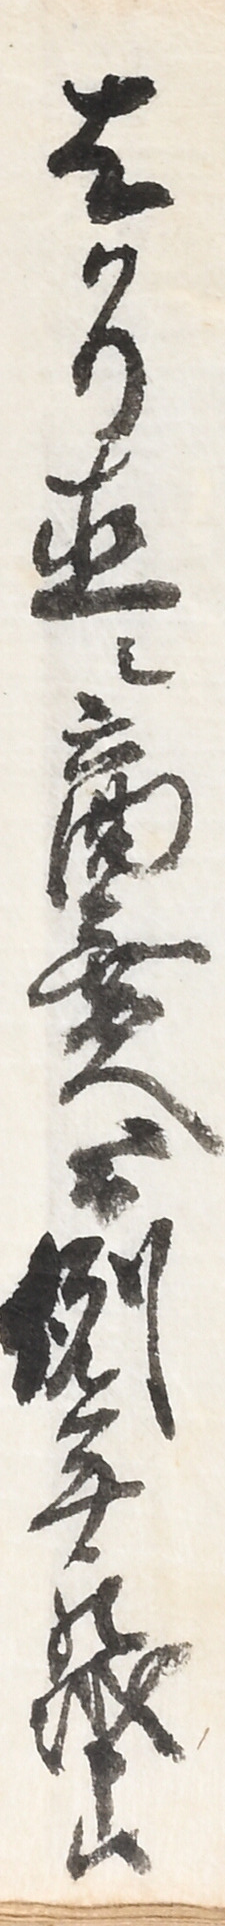はかり直シ商売ニ而例年罷越申候
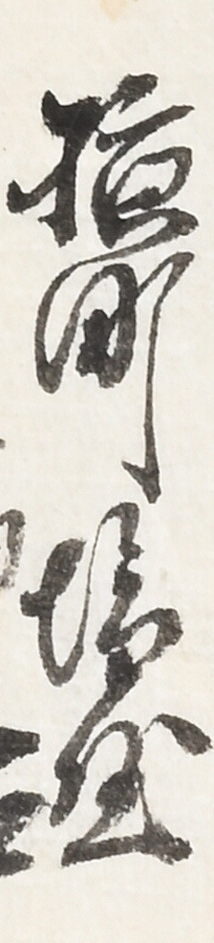横町塩屋
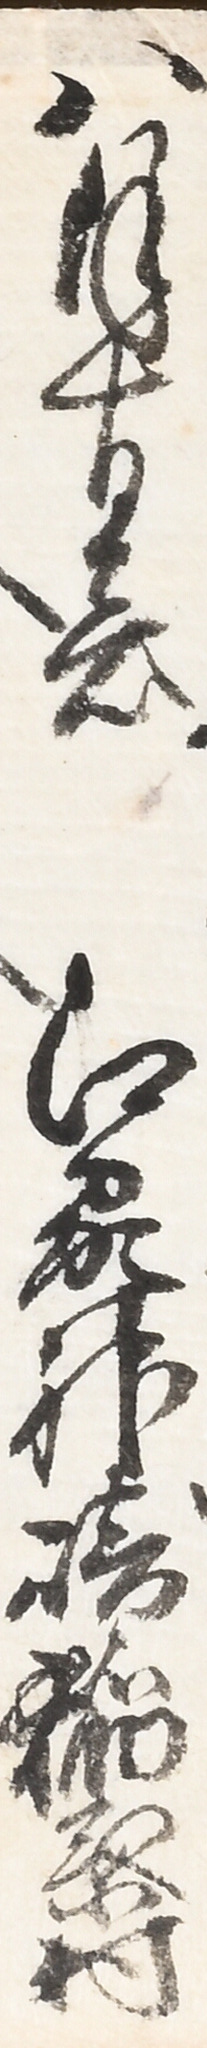八月十日着江州神崎郡稲葉村
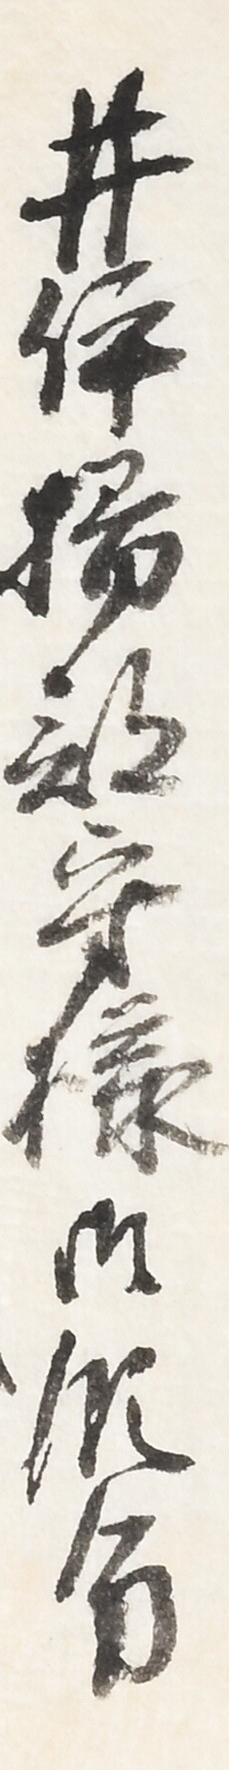井伊掃部頭様御領分
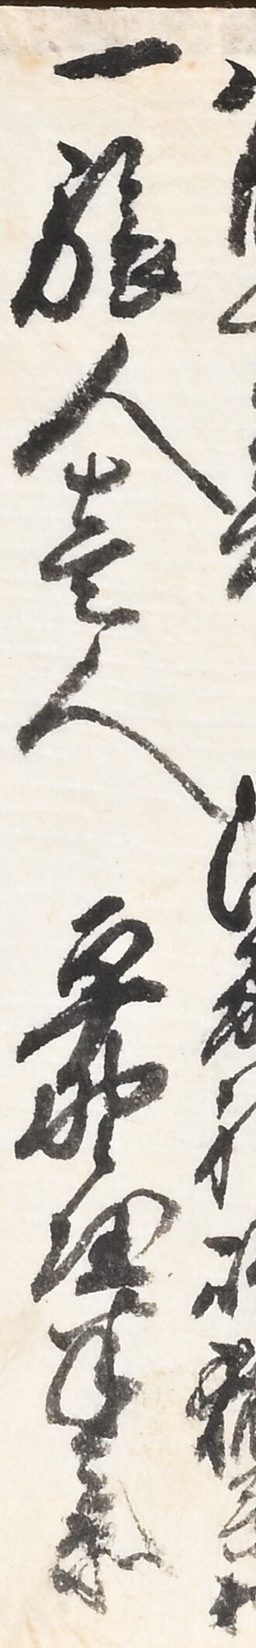一旅人壱人平野屋半兵衛
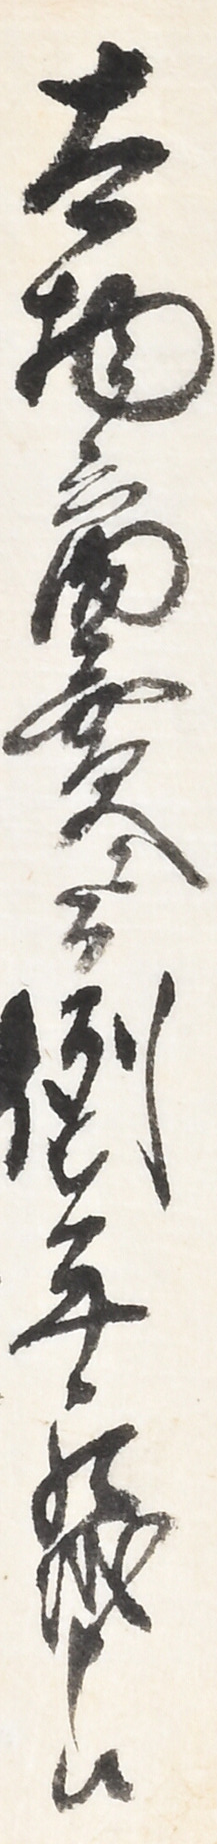太物商売ニ而例年罷越申候
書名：旅人泊控帳
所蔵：伊那市立高遠町図書館・合同会社AMANE
